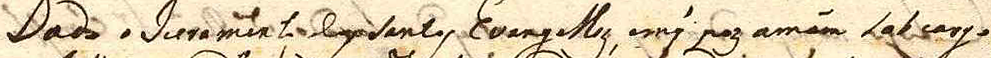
Dado o Iuramento dos santos Evangelhoz, em q̄ poz a mãm sob cargo
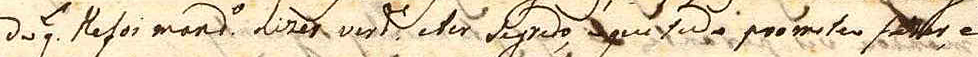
do q.l lhe foi mand.o dizer verd.e e ter segredo, e que tudo prometeo fazer, e
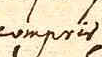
comprir.
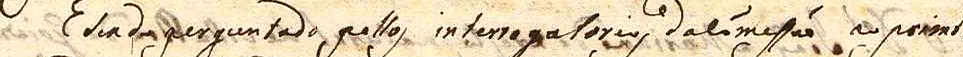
E sendo perguntado pellos interrogatorios da cōmissão ao primr.o
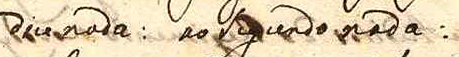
dice nada: ao segundo nada:
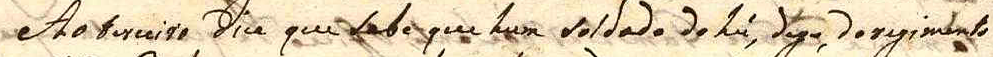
Ao terceiro dice que sabe que hum soldado do hū, digo, do regimento
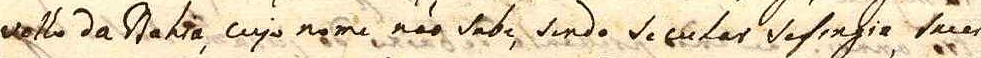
velho da Bahia, cujo nome não sabe, sendo secular se fingia sacer
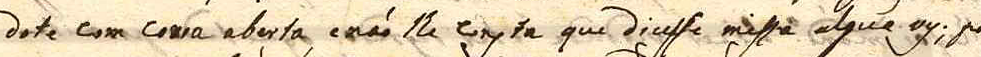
dote com coroa aberta, e não lhe consta que dicesse missa algūa ves; po
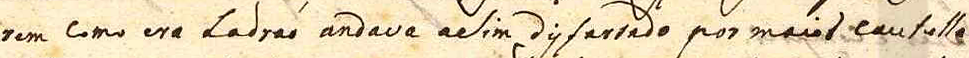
rem como era Ladraõ andava asim disfarsado por maior cautella
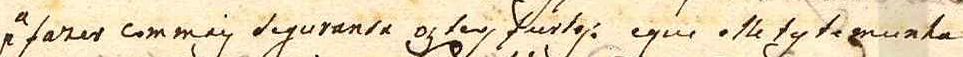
p.a fazer com mais seguransa oz seos furtos: e que elle testemunha
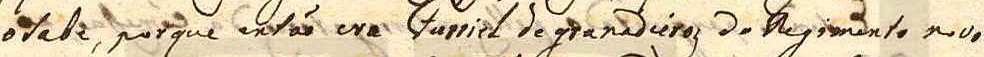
o sabe, porque então era Furriel de granadeiroz do Regimento novo
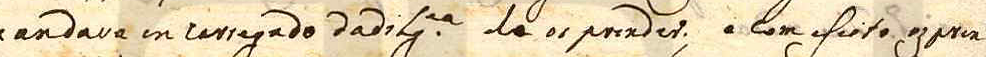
e andava encarregado da diLg.ca de os prender; e com efeito oz pren
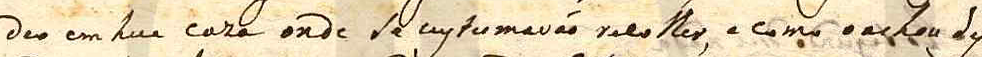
deo em hua caza onde se custumavaõ recolher, e como o achou des
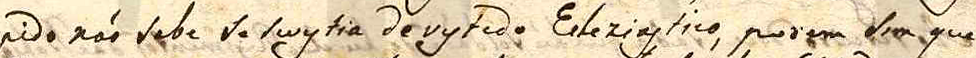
pido naõ sabe se se vestia de vestido EcLeziastico, porem sim que
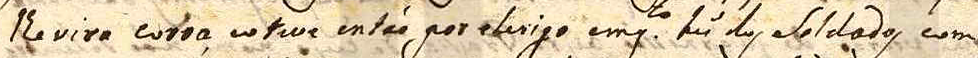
lhe vira coroa, e o teve entaõ por cLeigo emq.to hū dos soldados com
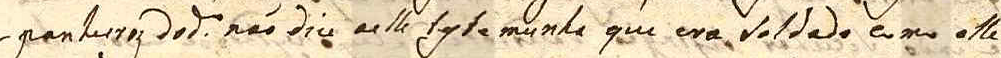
panheiroz do d.o naõ dice a elle testemunha que era soldado como elle.
